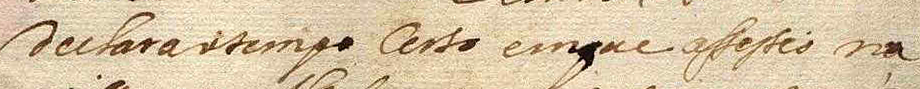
declara o tempo certo em que assestio na
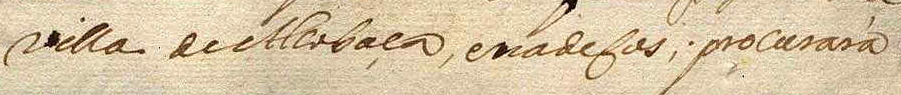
villa de Alcobaça, e na de Cos; procurará
